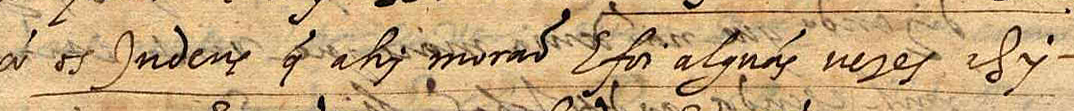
cō os Judeus q̄ ahy moraõ E foi alguās uezes a sy
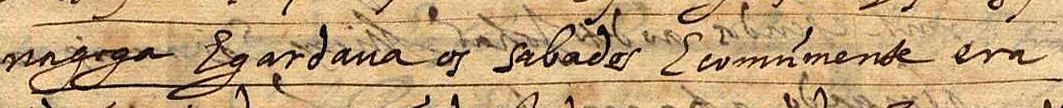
nagoga E gardaua os sabados E comūmente era
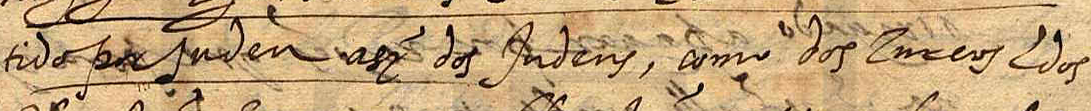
tido por judeu asȳ dos Judeus, como dos Turcos E dos
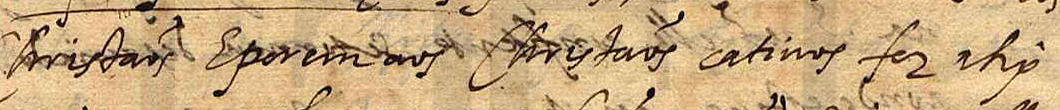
Christaõs E porem aos Christaõs catiuos fez ahy
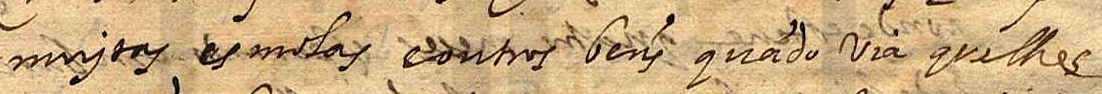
mujtas esmolas e outros bens̄ quādo via que lhes
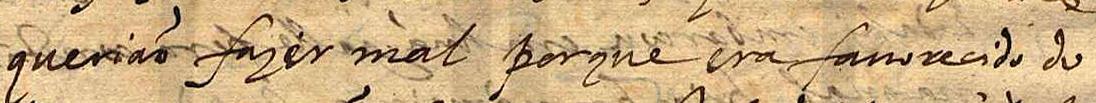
queriaõ fazer mal porque era fauorecido do
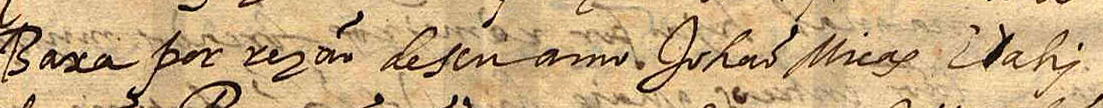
Baxa por rezaõ de seu amo Johaõ Micas E dahy
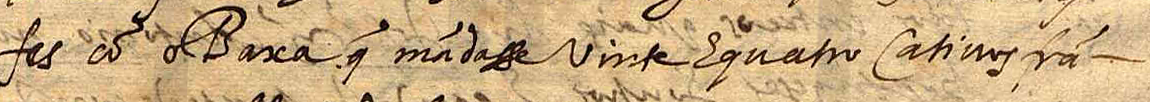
fes cō o Baxa q̄ mādasse vinte E quatro Catiuos frā
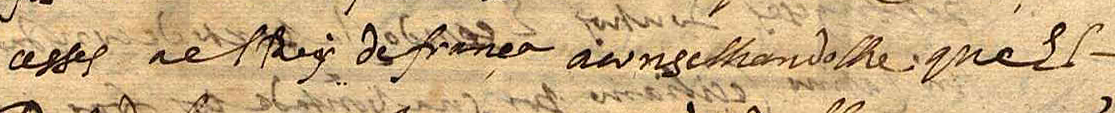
cesses a el Rey de frança aconselhandolhe que El
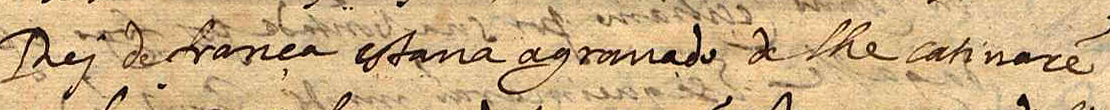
Rej de frança estaua agrauado de lhe catiuarē
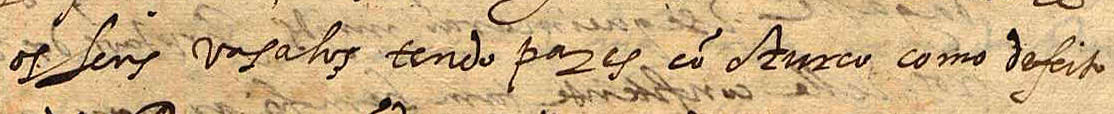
os seus vasalos tendo pazes cō o turco como de feito
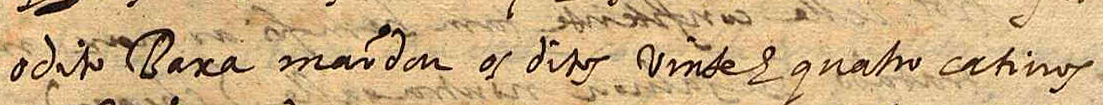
o dito Baxa maõdou os ditos vinte E quatro catiuos
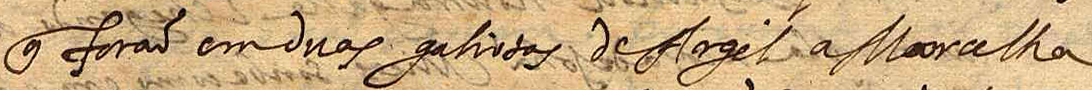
q̄ foraõ em duas galiotas de Argel a Marcelha
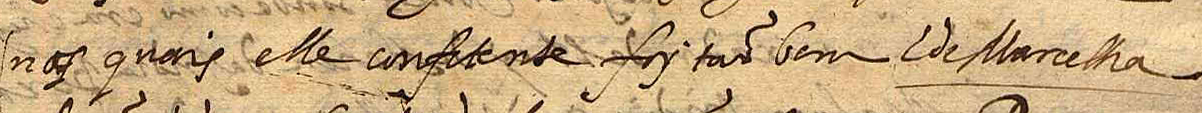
nos quais elle confitente foy taõbem E de Marcelha
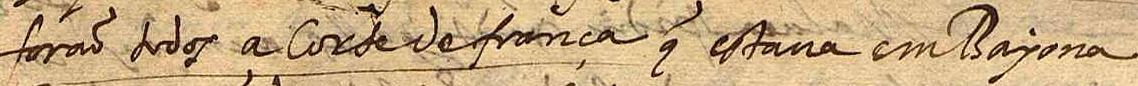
foraõ todos a Corte de frança q̄ estaua em Bayona
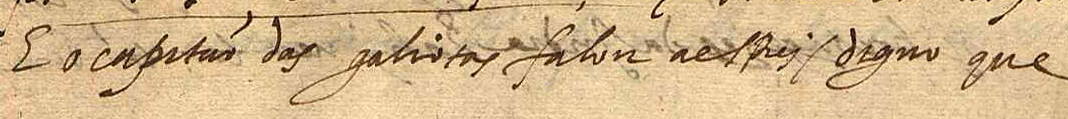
E o capitaõ das galiotas falou a el Rej / diguo que
